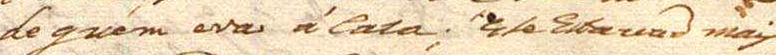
de quem era á caza; e se Estauaõ mais
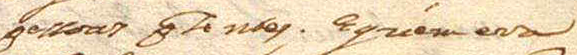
pessoas p̄zentes; E quem era
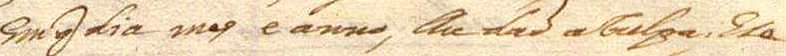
Em q̄ dia mes e anno, lhe daõ a Culpa; E se
